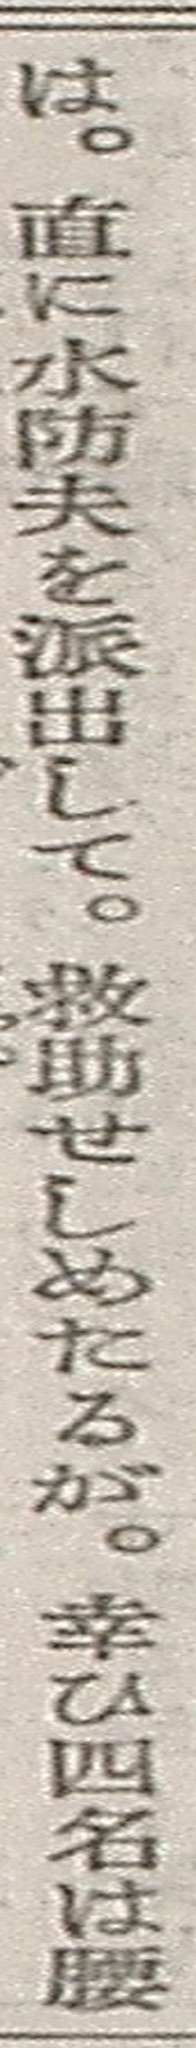は。直に水防夫を派出して。救助せしめたるが。幸ひ四名は腰
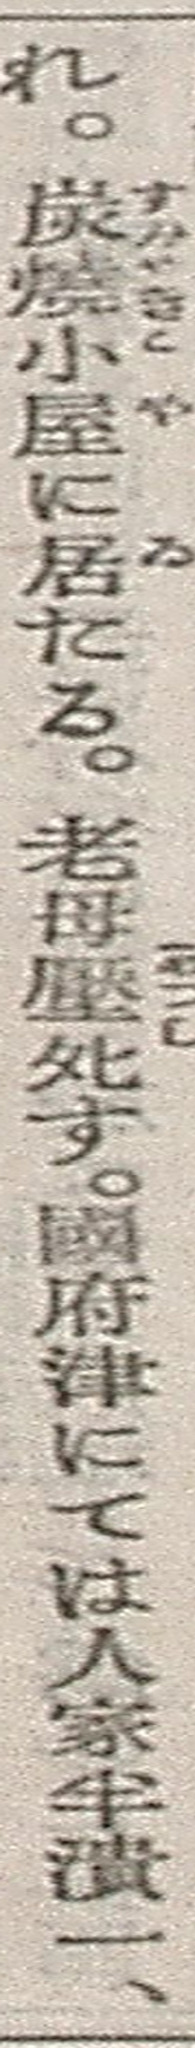れ。炭焼小屋に居たる。老母圧死す。国府津にては人家半潰一、
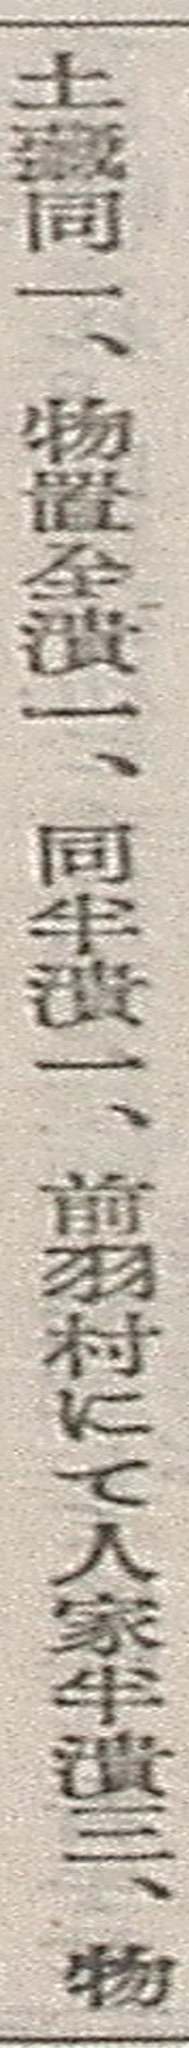土蔵同一、物置全潰一、同半潰一、前羽村にて人家半潰三、物
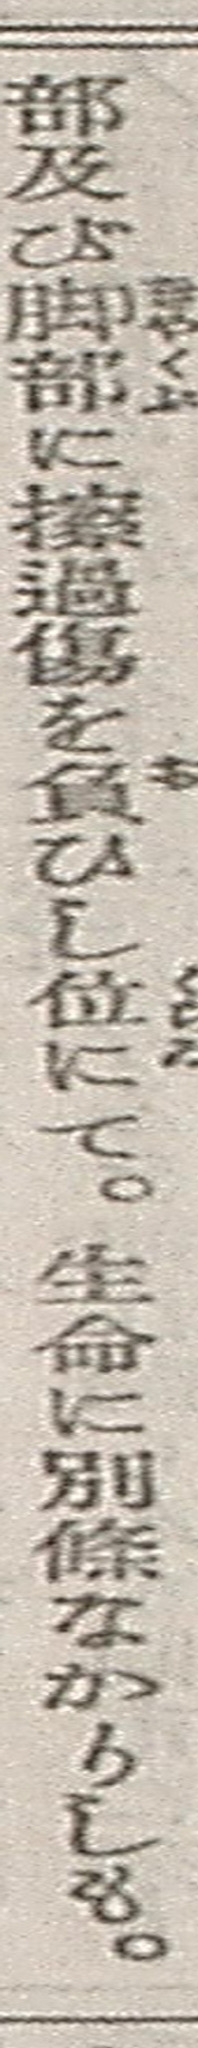部及び脚部に擦過傷を負ひし位にて。生命に別条なかりしも。
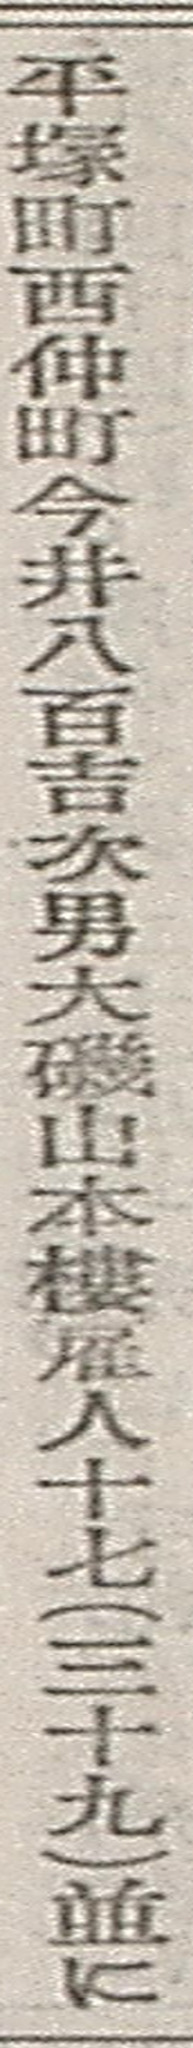平塚町西仲町今井八百吉次男大磯山本楼雇人十七並に
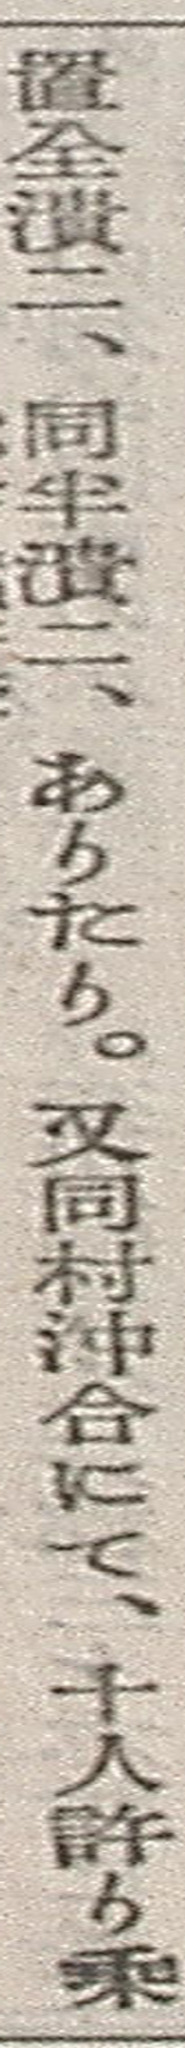置全潰二、同半潰二、ありたり。又同村沖合にて、十人許り乗
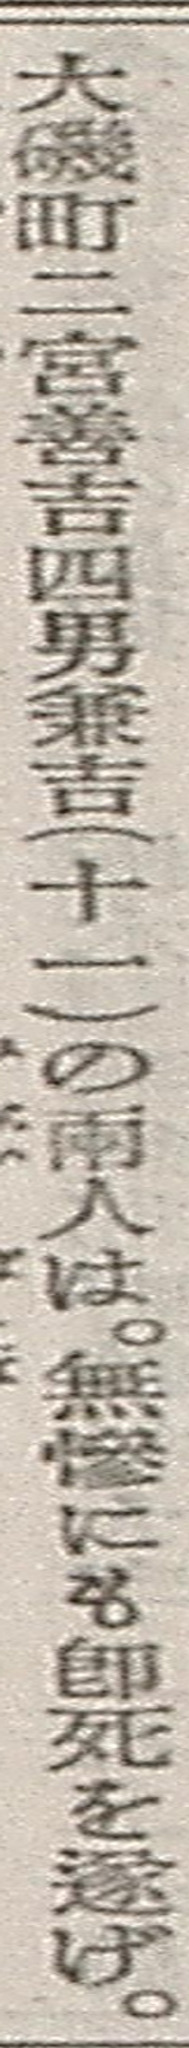大磯町二宮善吉四男兼吉の両人は。無惨にも即死を遂げ。
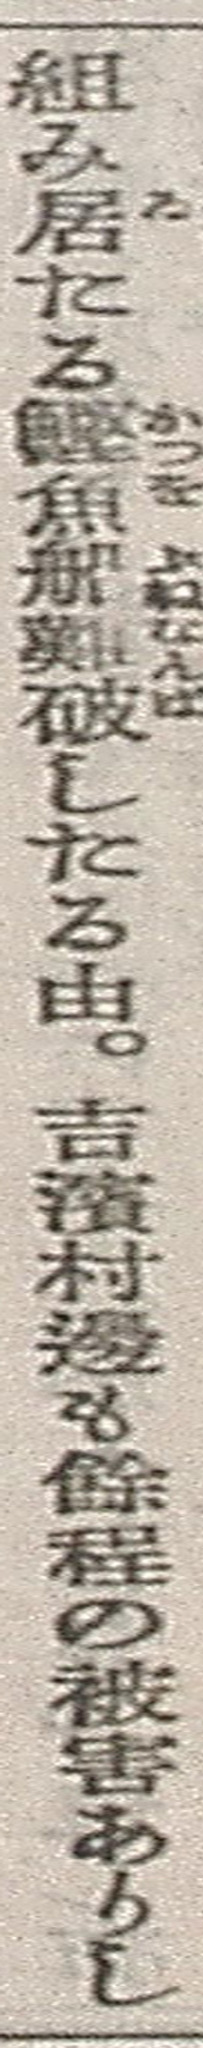組み居たる鰹魚船難破したる由。吉浜村辺も余程の被害ありし
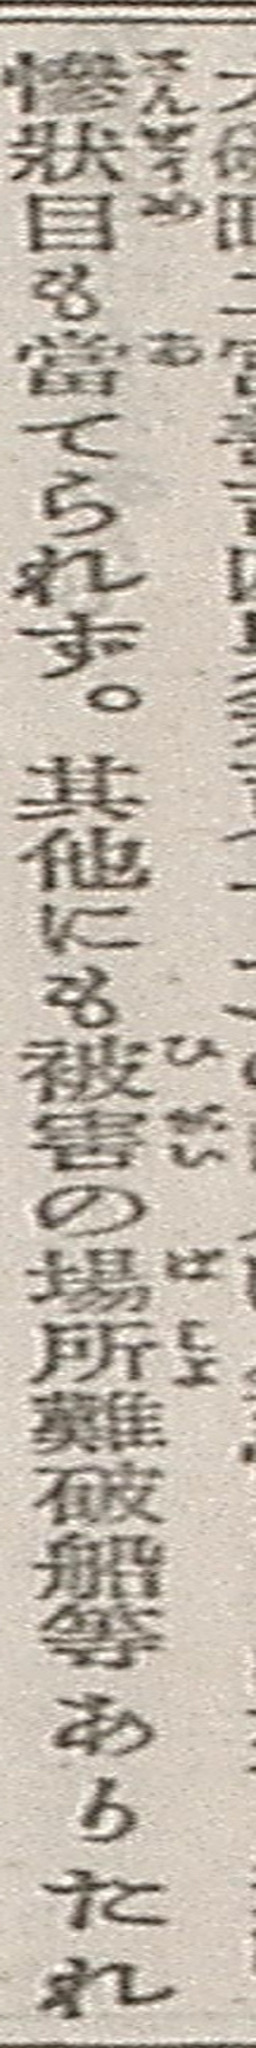惨状目も当てられず。其他にも被害の場所難破船等ありたれ
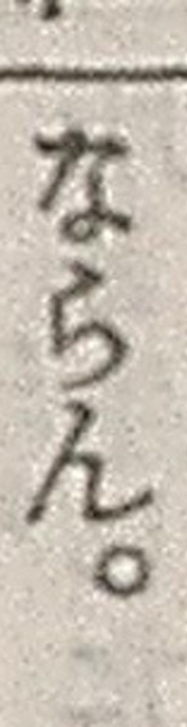ならん。
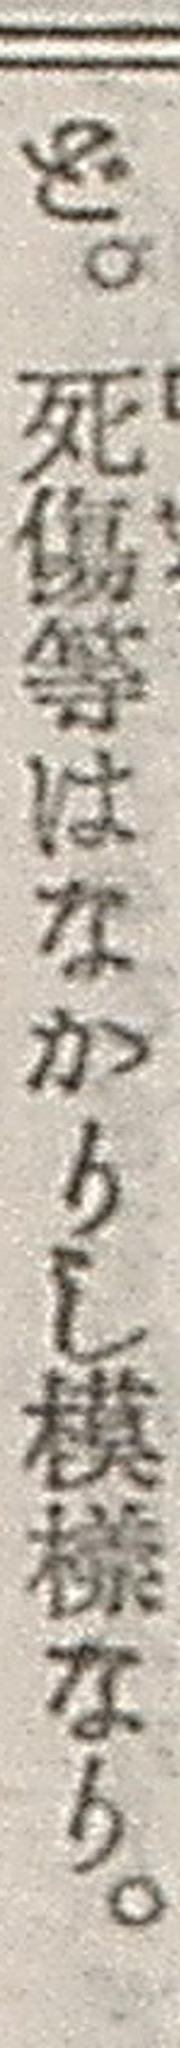ど。死傷等はなかりし模様なり。
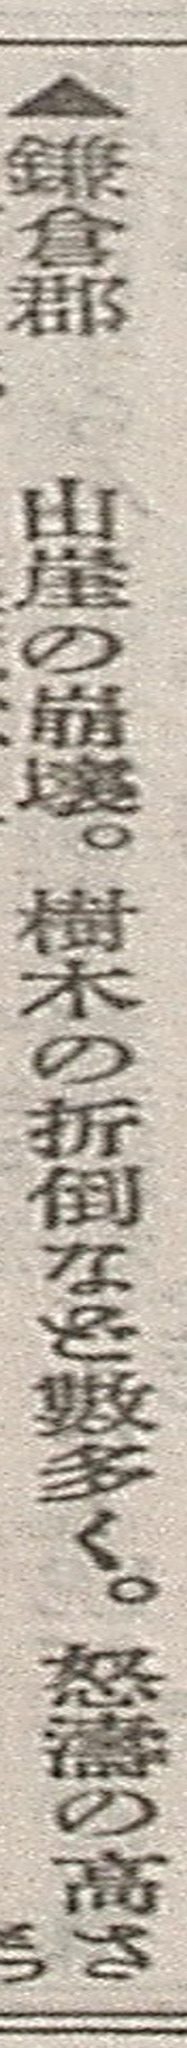▲鎌倉郡山崖の崩壊。樹木の折倒など数多く。怒涛の高さ
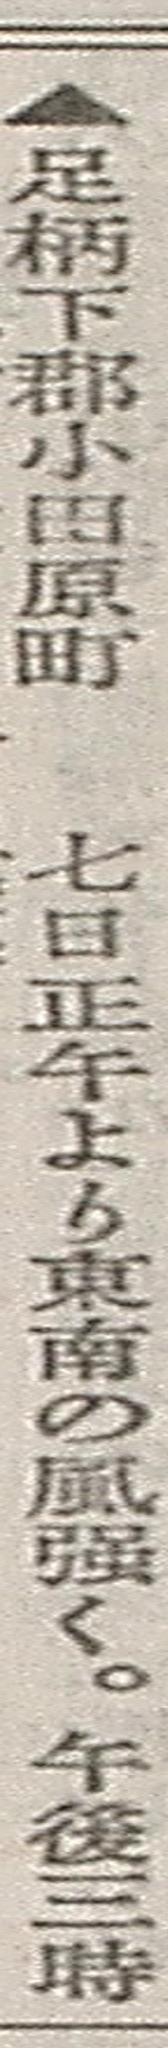▲足柄下郡小田原町七日正午より東南の風強く。午後三時
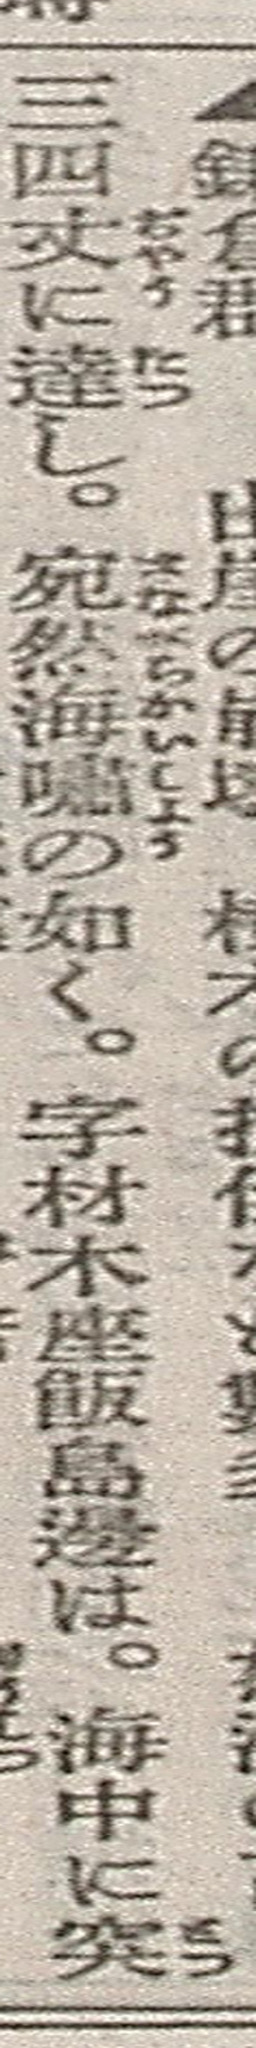三四丈に達し。宛然海嘯の如く。字材木座飯島辺は。海中に突
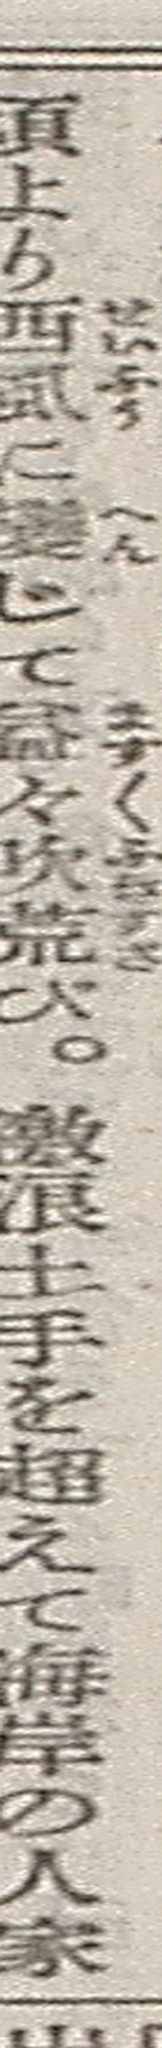頃より西風に変じて益々吹荒び。激浪土手を超えて海岸の人家
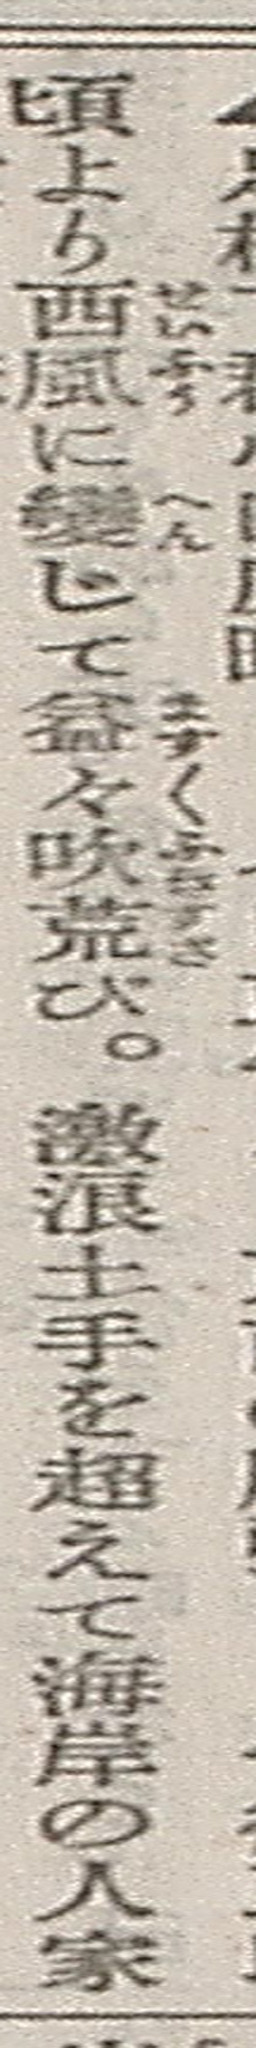頃より西風に変じて益々吹荒び。激浪土手を超えて海岸の人家
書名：風俗畫報臨時増刊第百九十九號　明治三十二年十月各地災害圖會（前編之續）
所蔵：東京大学地震研究所図書室 Earthquake Research Institute Library, The University of Tokyo, JAPAN
